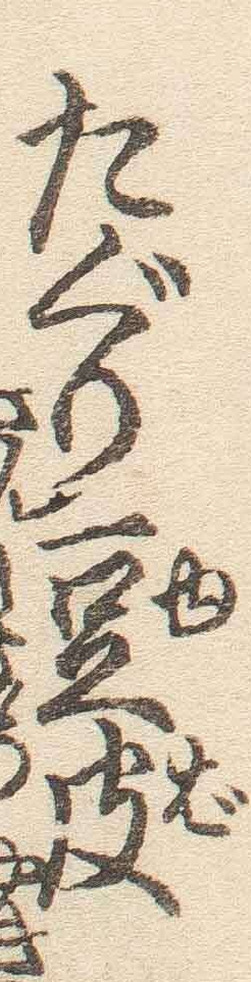たぐり豆皮
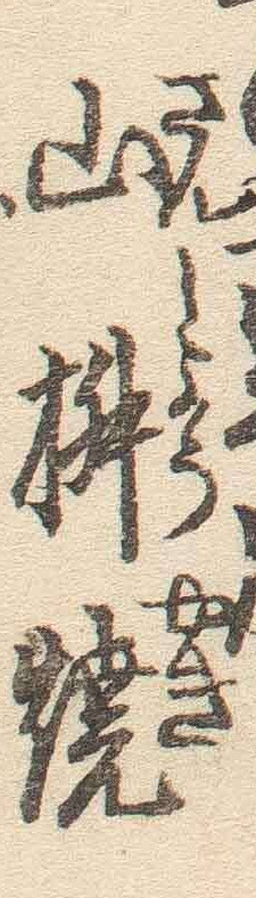山枡焼
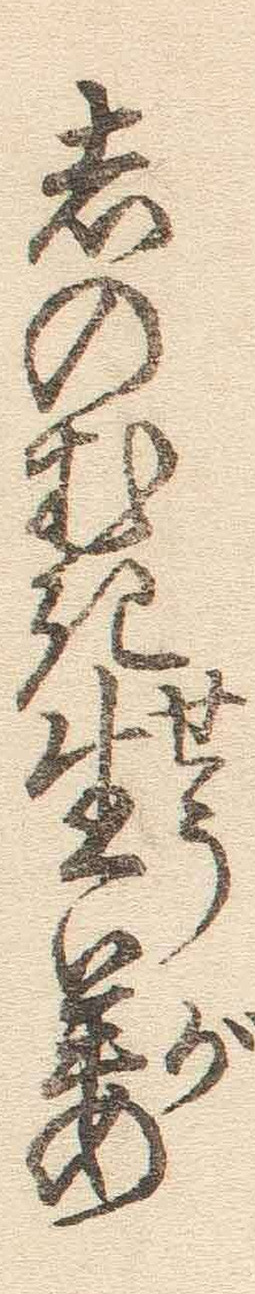しのむき生姜
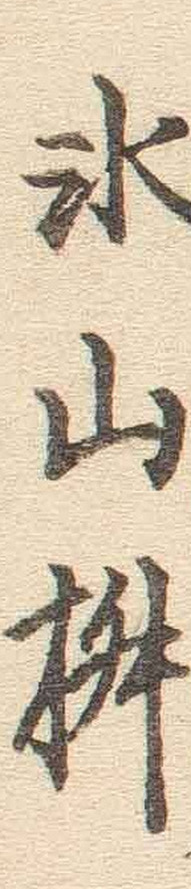煮山枡
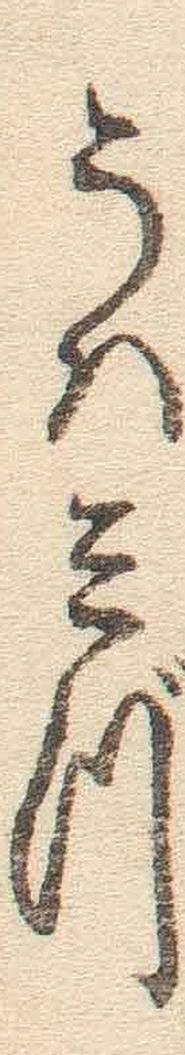うはみづ

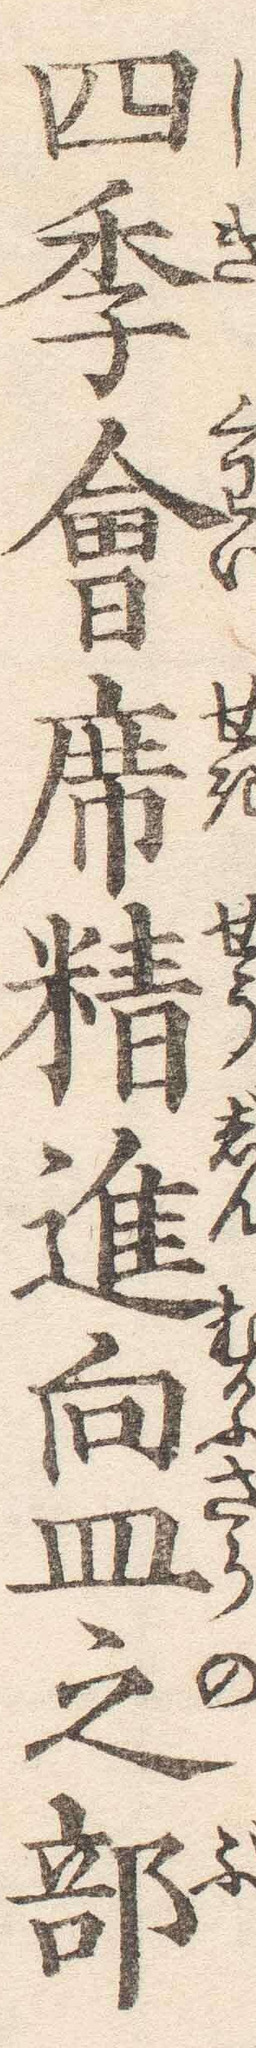四季会席精進向皿之部
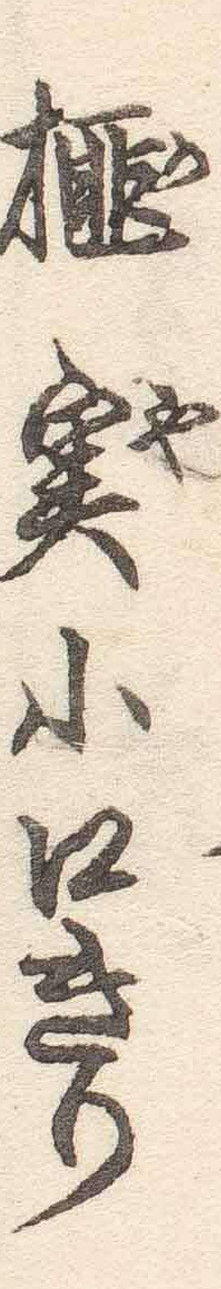榧実小口きり
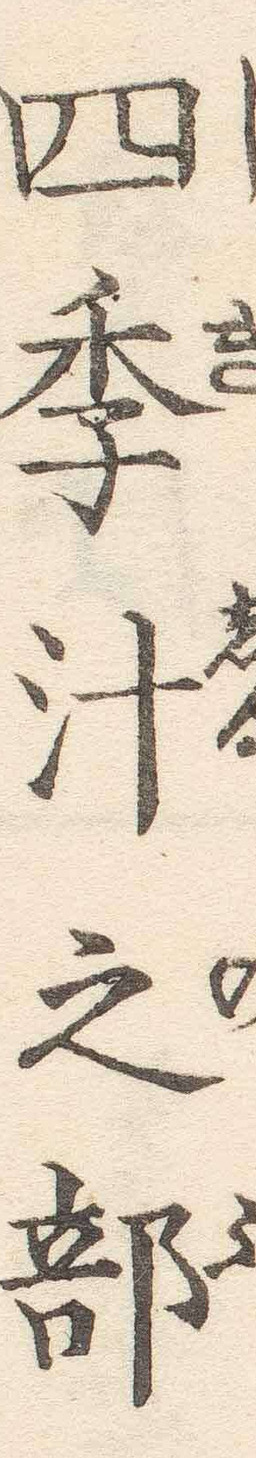四季汁之部
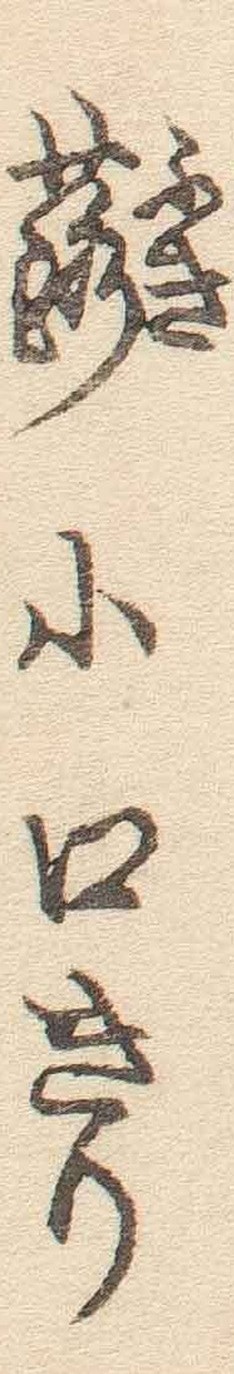榧実小口きり

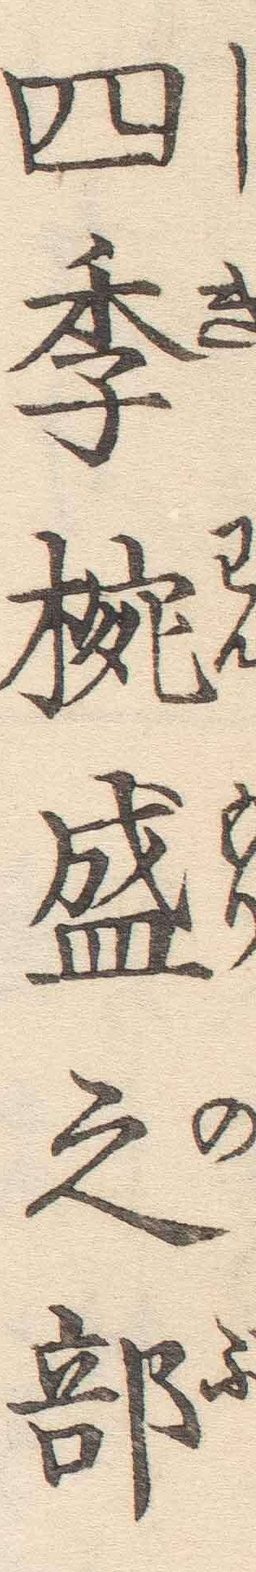四季椀盛之部
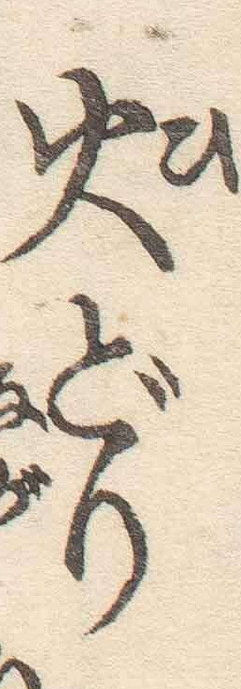火どり
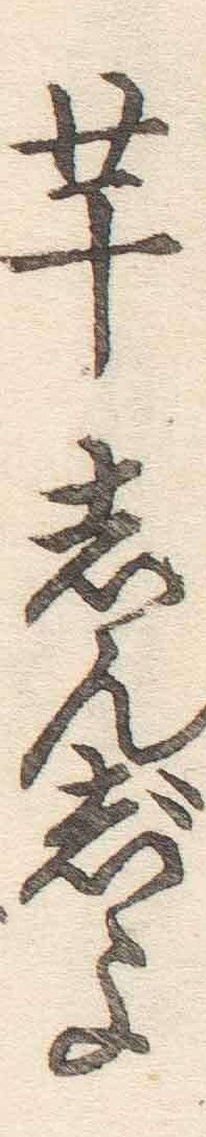芋しんじよ
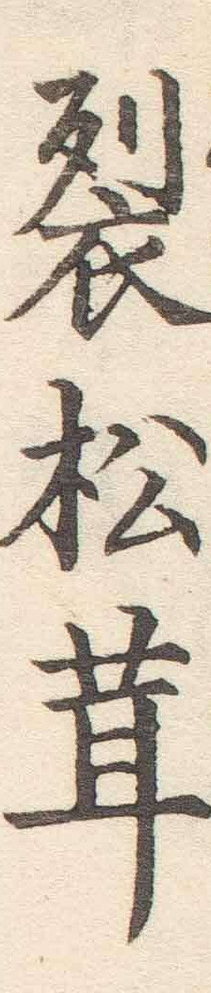裂松茸
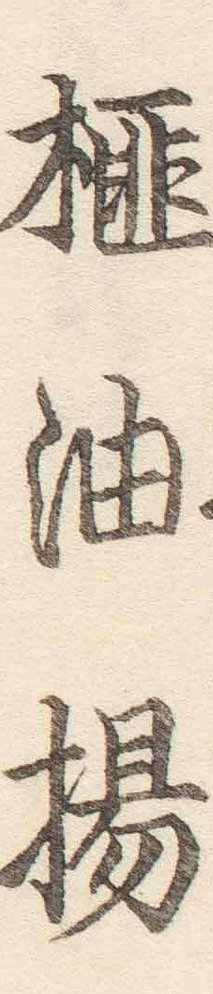榧油揚
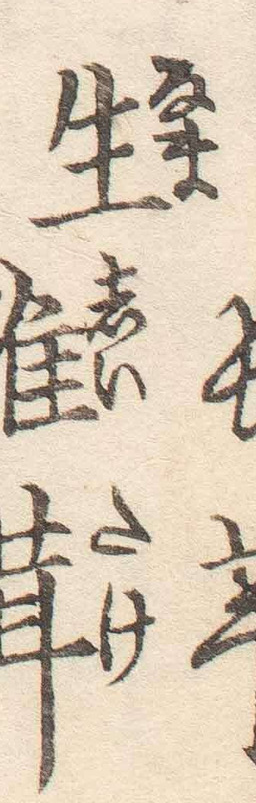生椎茸
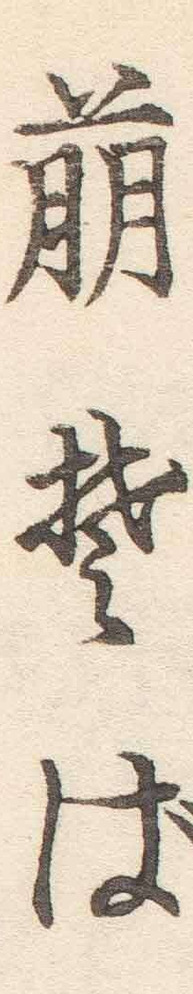萌そば
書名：料理通
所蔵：東京学芸大学附属図書館 国文学研究資料館
